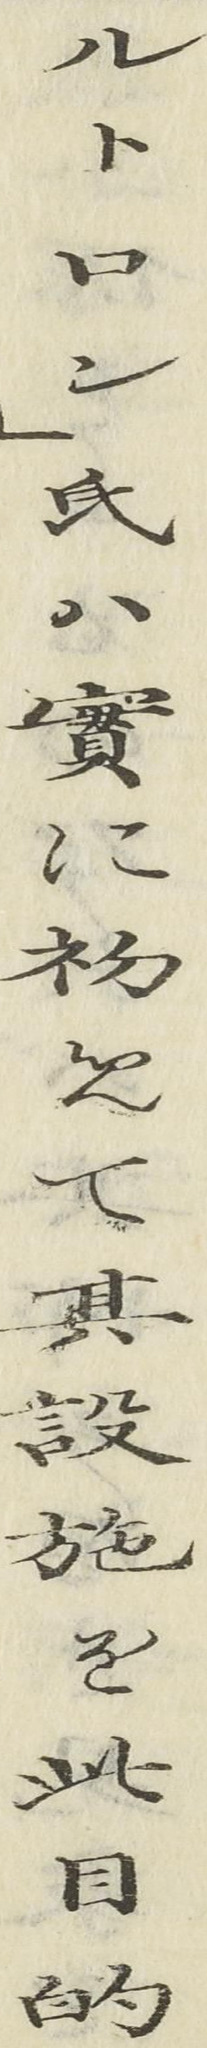ルトロン」氏は実に初めて其設施を此目的
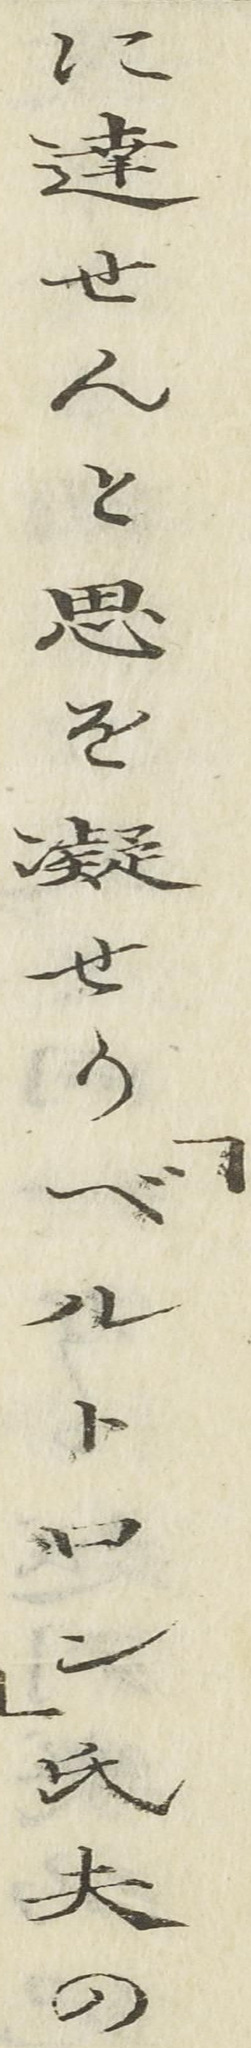に達せんと思を凝せり「ベルトロン」氏夫の
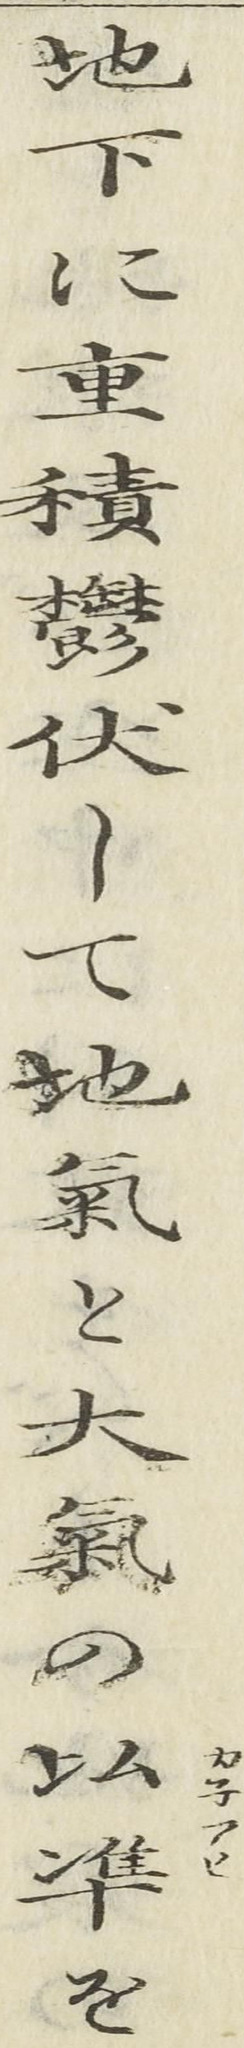地下に重積鬱伏して地気と大気の比準を
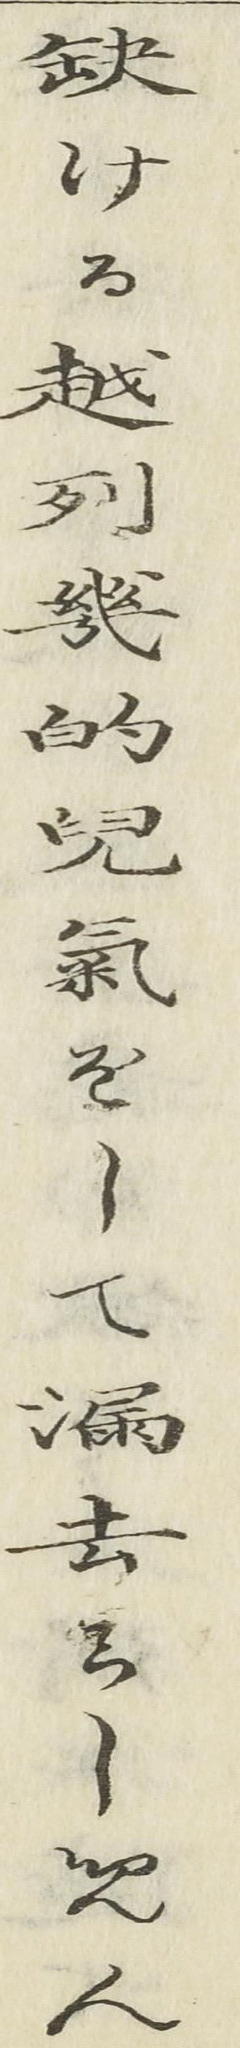缺ける越列幾的児気をして漏去らしめん
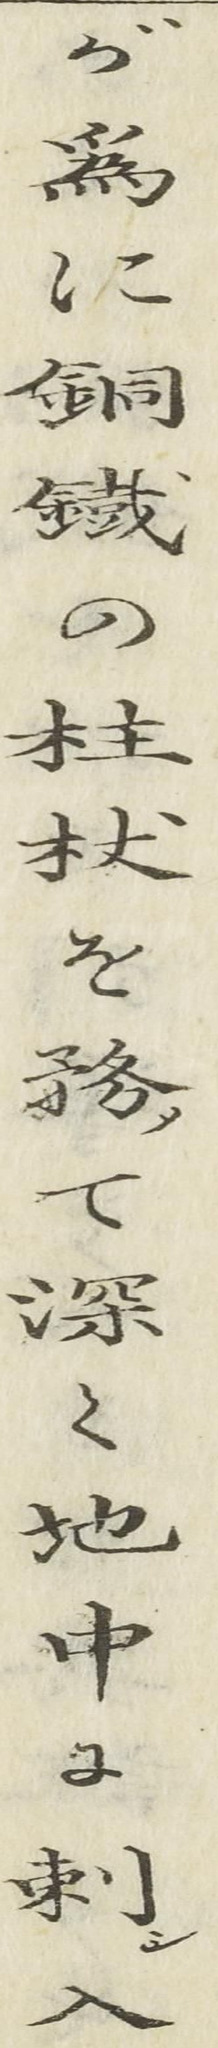が為に銅鉄の柱杖を務て深く地中に刺し入
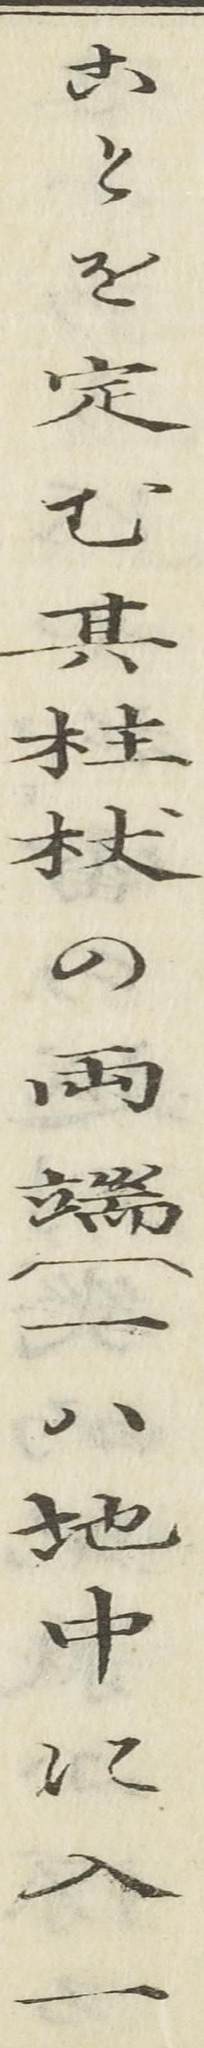ことを定む其柱杖の両端〔一は地中に入一
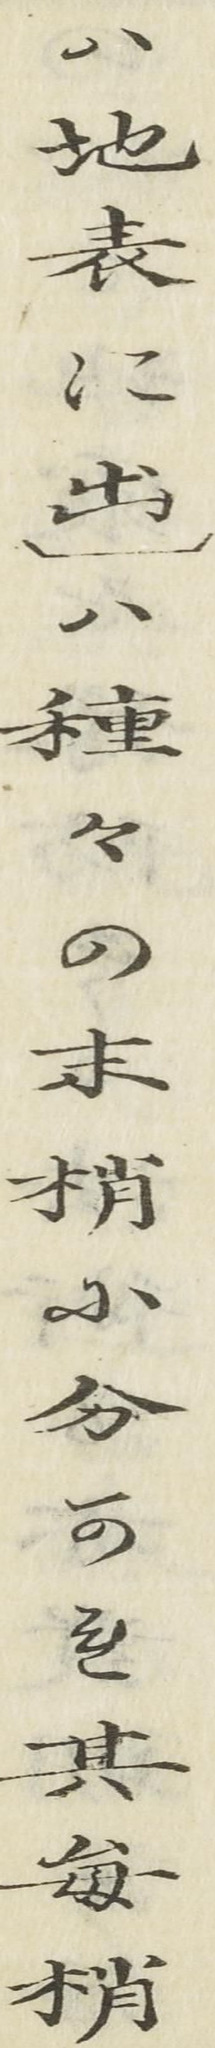は地表に出〕は種々の末梢に分かれ其毎梢
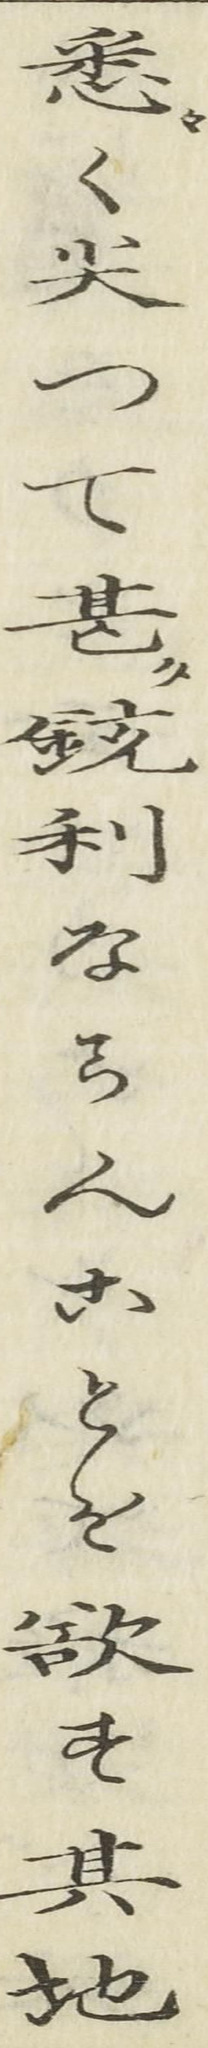悉々く尖つて甚鋭利ならんことを欲す其地
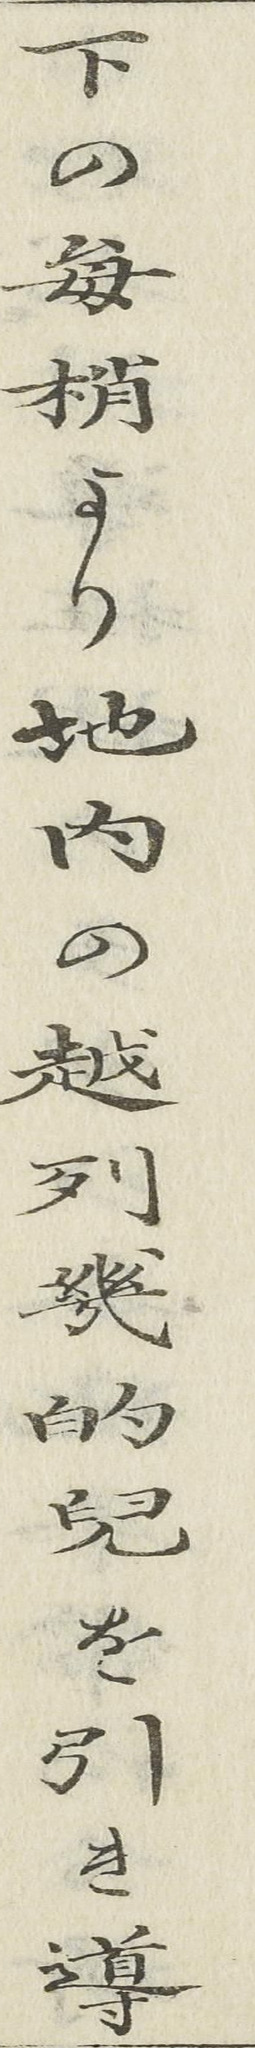下の毎梢より地内の越列幾的児を引き導
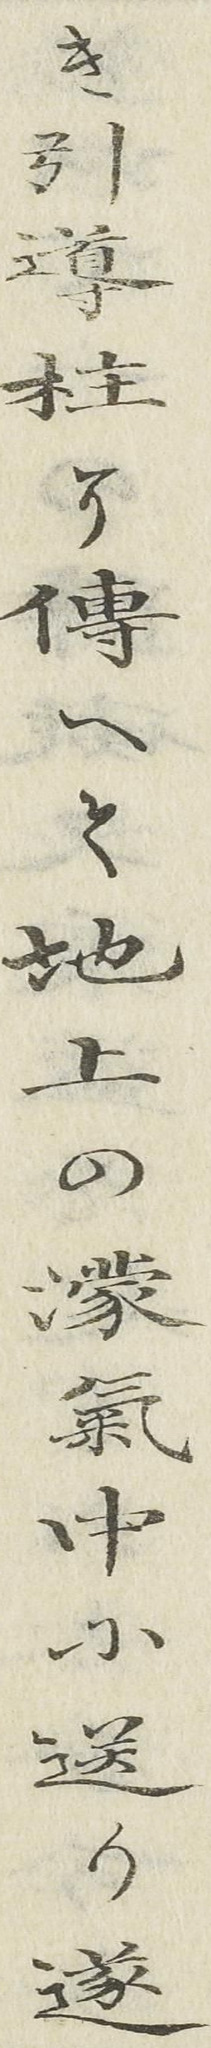き引導柱に伝へて地上の濛気中に送り遂
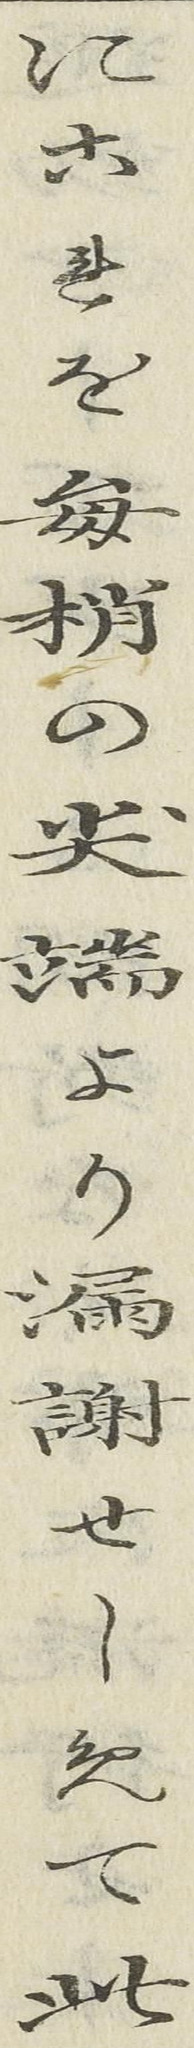にこれを毎梢の尖端より漏謝せしめて此

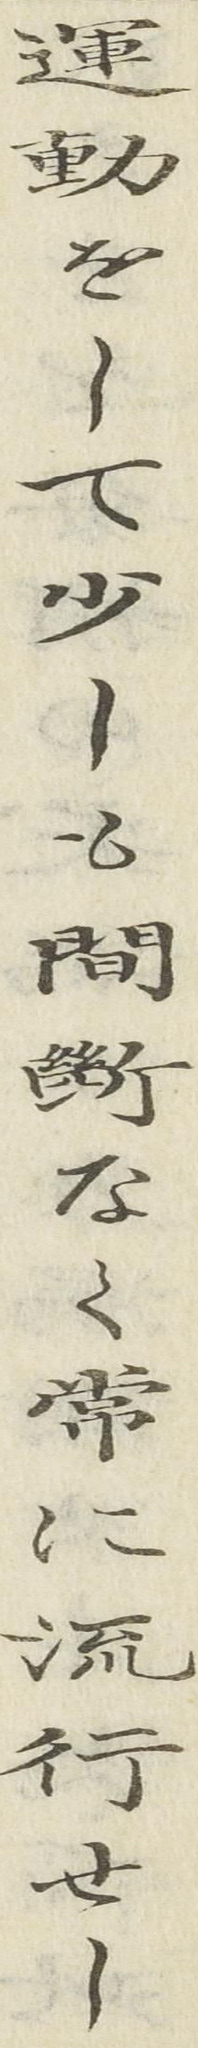運動をして少しも間断なく常に流行せし
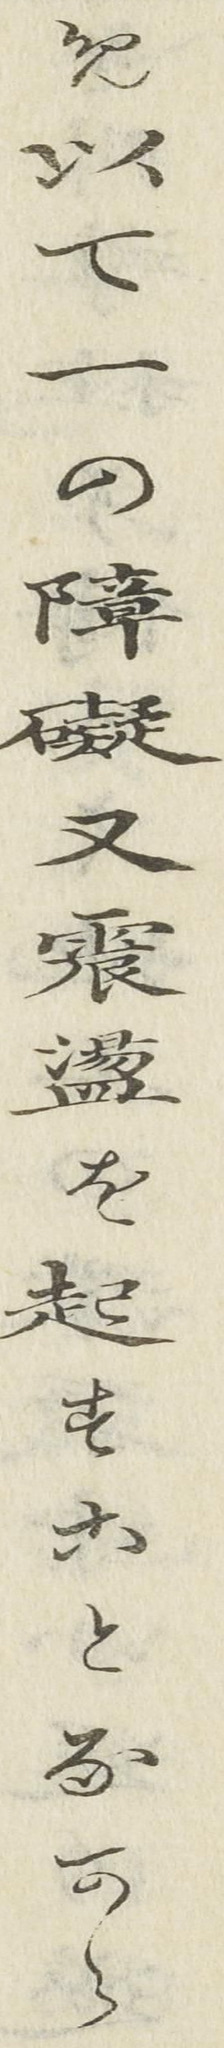め以て一の障礙又震盪を起すことなから
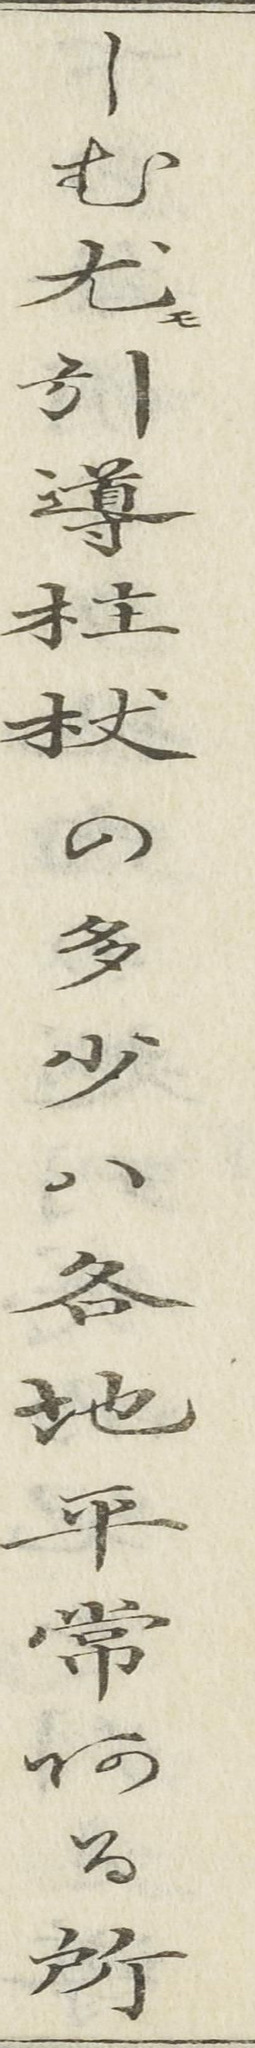しむ尤も引導柱杖の多少は各地平常ある所
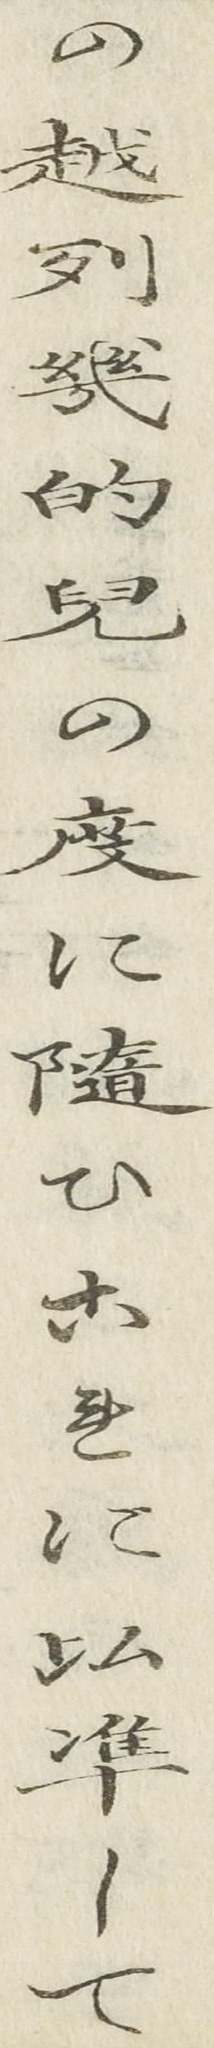の越列幾的児の度に随ひこれに比準して
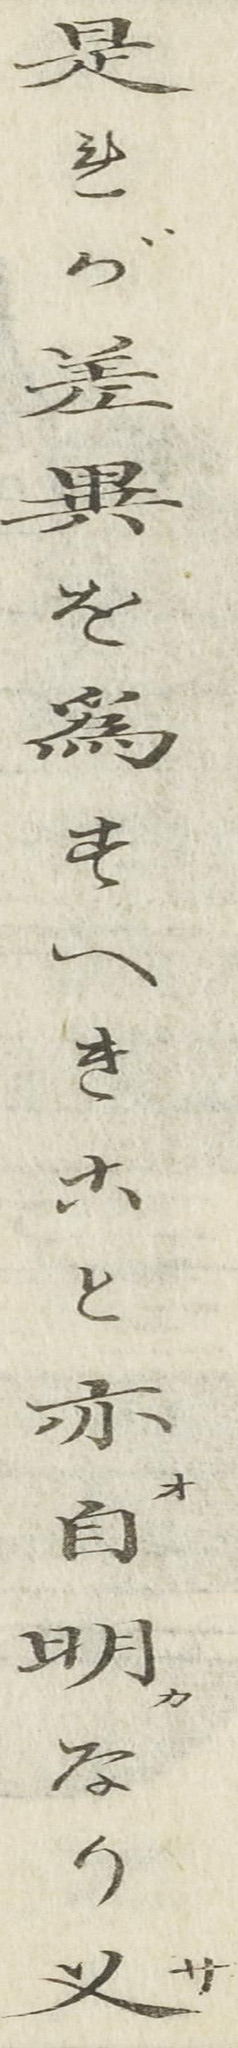是れが差異を為すべきこと亦自明かなり叉
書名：地震預防説
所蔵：東京大学地震研究所図書室 Earthquake Research Institute Library, The University of Tokyo, JAPAN
